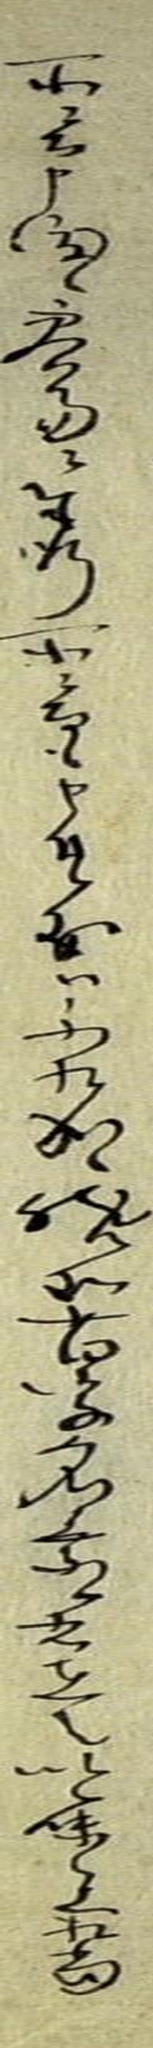所ニ而申渡候容易ニ奉行所ニ而も申付候義ハ不相成候然ル所苗字名乗候者在之吟味之上相当
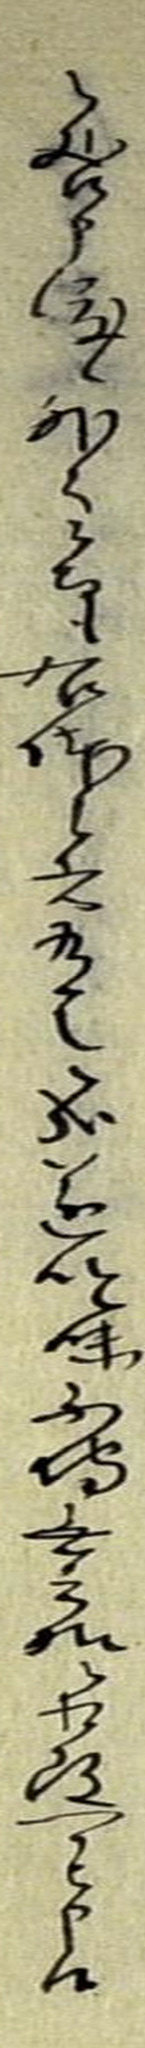之咎申渡候外々ニ而も右体之者有之候哉遂吟味不埒無之様ニ相改可被申候
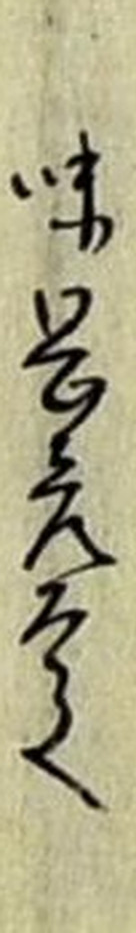味岡彦大夫
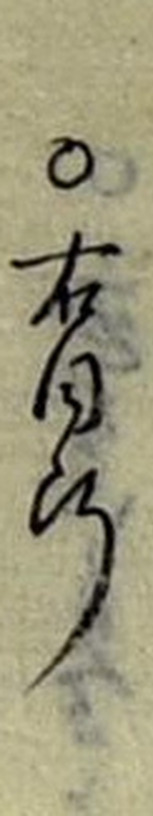〇右同断
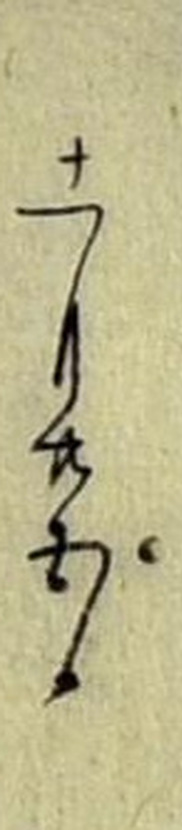十一月廿五日

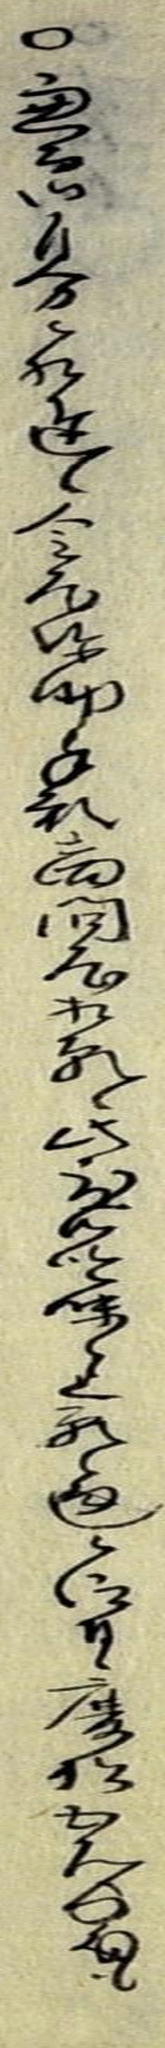岩上梶大夫〇兼而御自分被相達候金屋弥助手形商問屋相願候此度御吟味之上願之通被仰付候慶松五右衛門義も
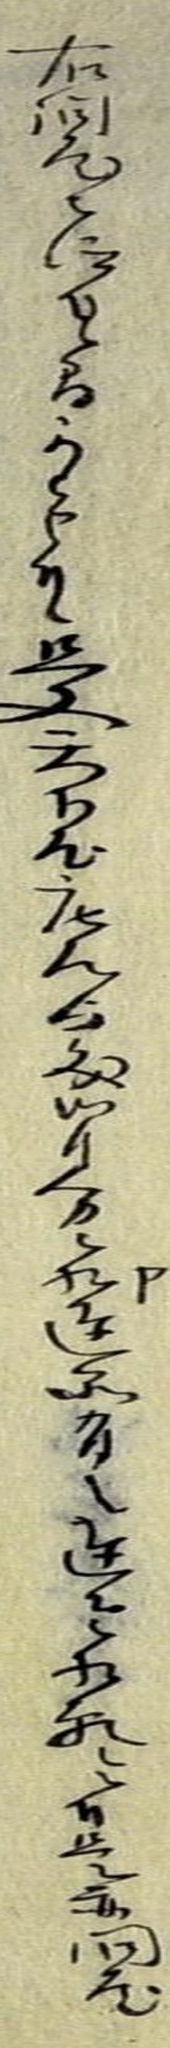右問屋被仰付候間可被申付候且又天下屋庄左衛門義御自分被相申達品有之達而被相願候ニ付是亦問屋
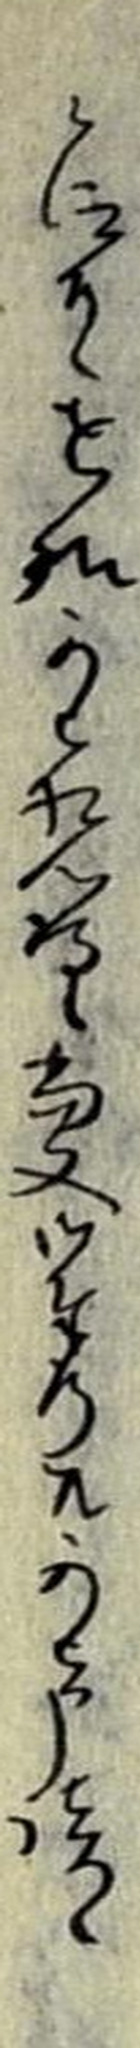被仰付候左様可被相心得候尚又御奉行共可被申談候
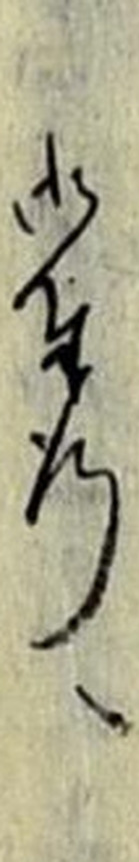御奉行へ
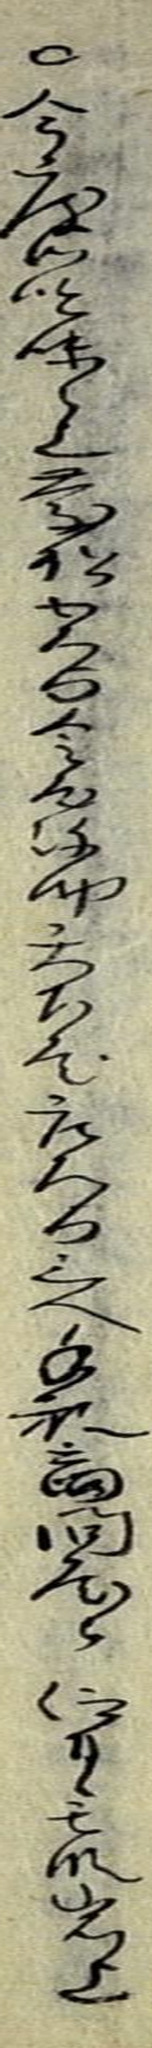〇今度御吟味之上慶松五右衛門金屋弥助天下屋庄左衛門三人手形商問屋被仰付候其段岩上
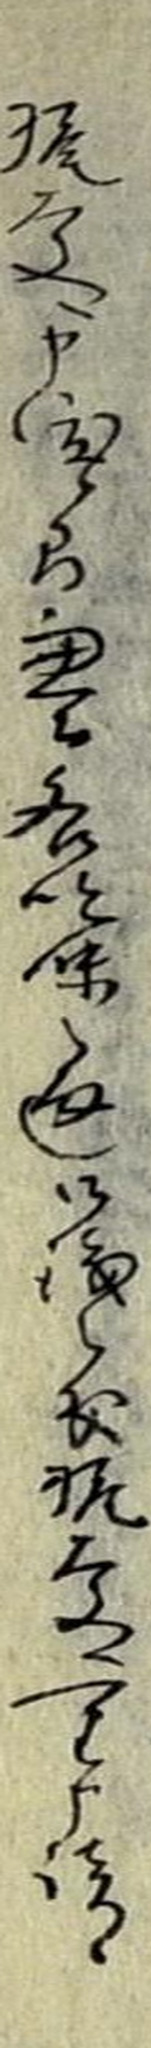梶大夫へ申渡候間兼而各吟味之通口銭之義梶大夫へ可被申談候
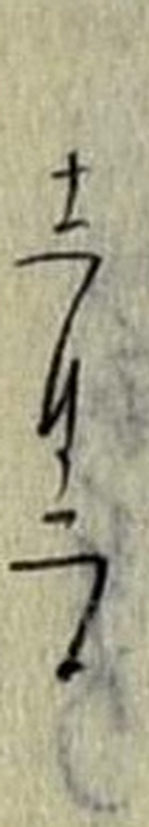十二月二日
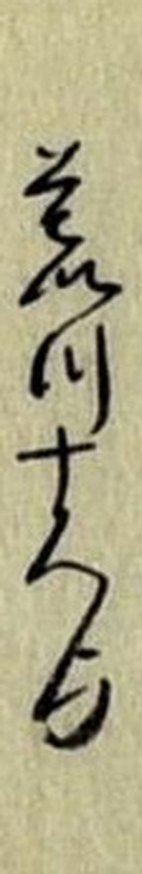荒川十右衛門
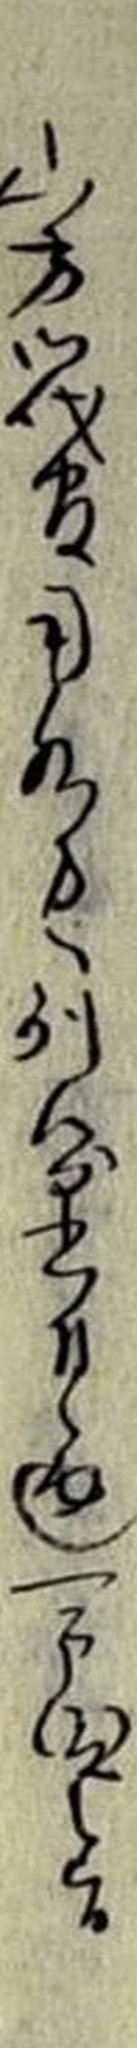山方御代官用水方へ別紙書付之通可申渡之旨
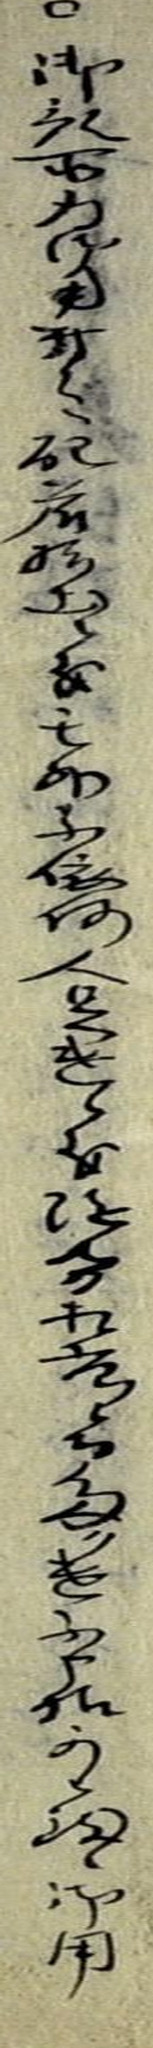〇御預所為御用村々へ配府指出候義其外不依何人足遣候義随分相考候而多ク遣不申様可被致候御用
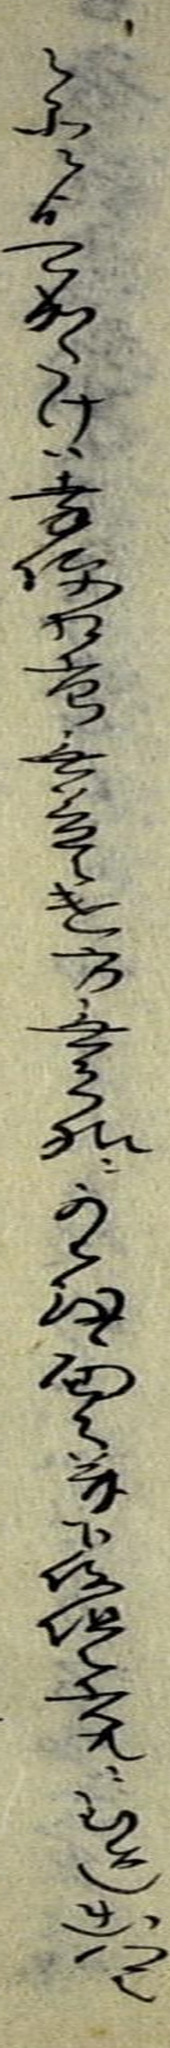之品ニゟ可成たけハ幸便相考無益之遣方無之様ニ可被致候面々并下役組之者共ニ至迄出郷之
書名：命令之部 一
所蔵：福井県文書館 Fukui Prefectural Archives
